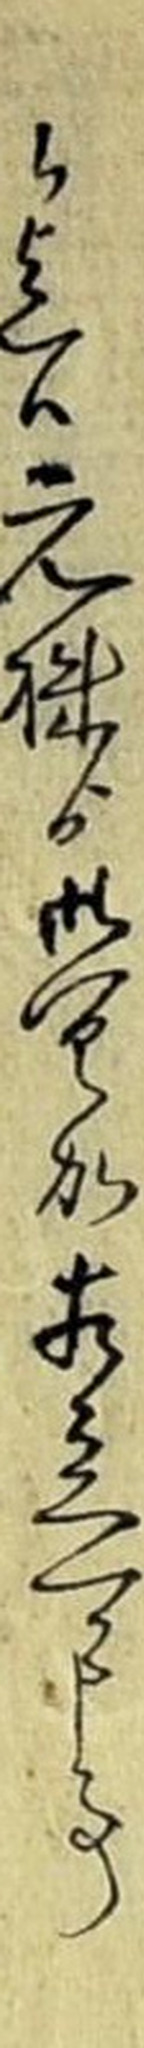候迄は元株ゟ御冥加相立可申事
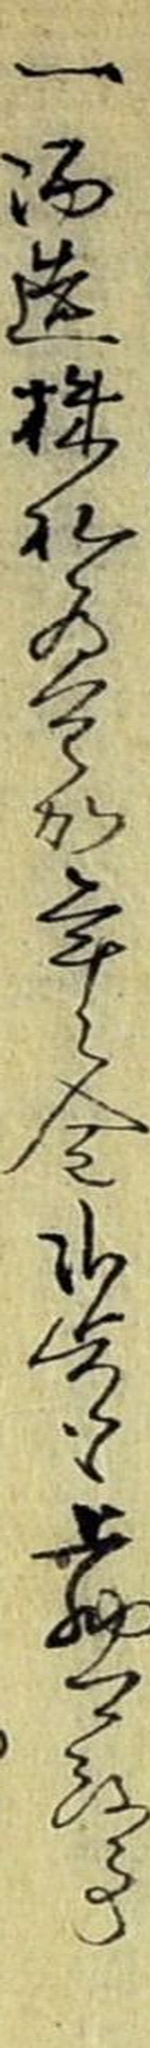一酒造株札為冥加年々金弐歩つヽ上納可致事
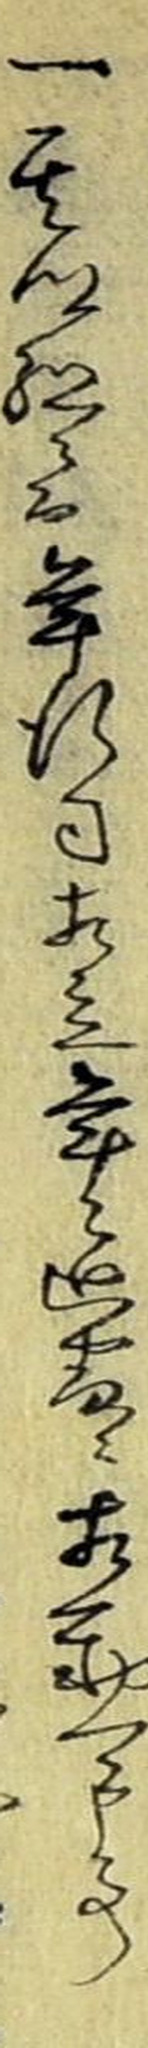一其郷組に而年行司相立年々廻番に相勤可申事
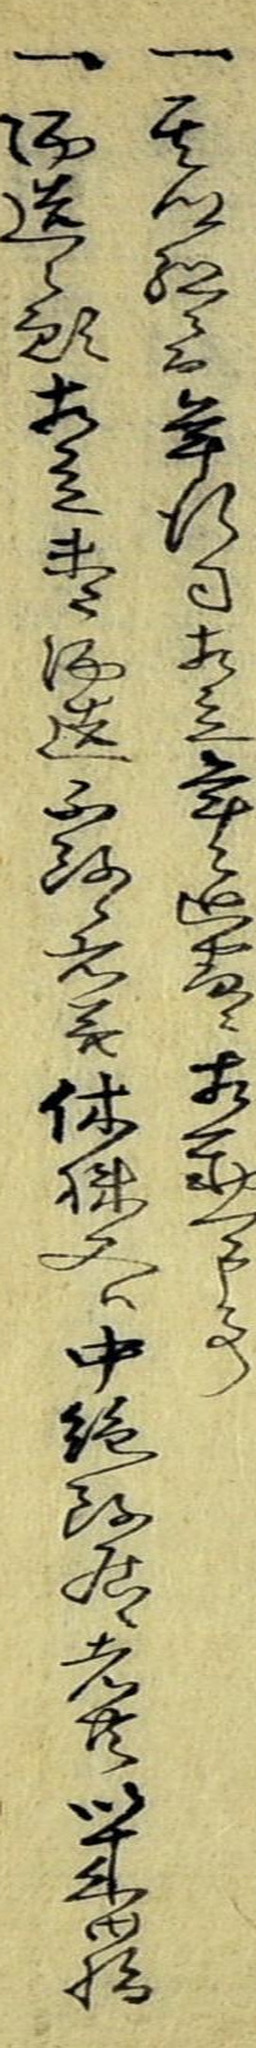一酒造之願相立未た酒造不致候者井休株又は中絶致居候者共以来御指
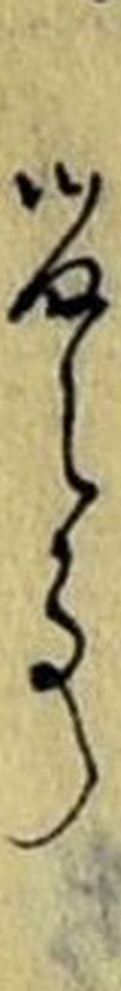留之事

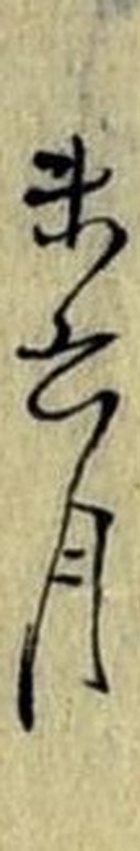未六月
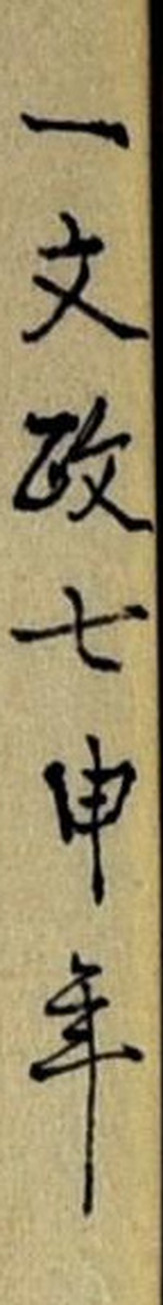一文政七申年
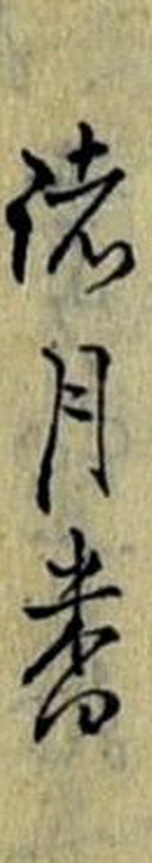諸月番
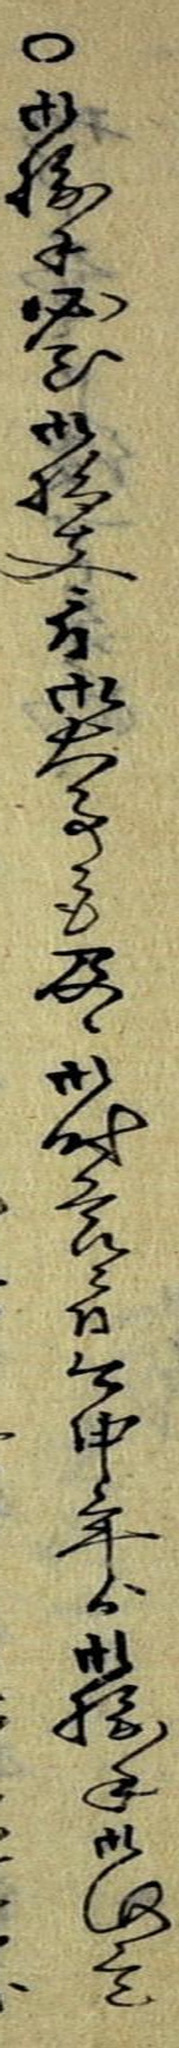○御勝手必至御指支に付御大事にも及候御時節に付今申年ゟ御勝手御趣意
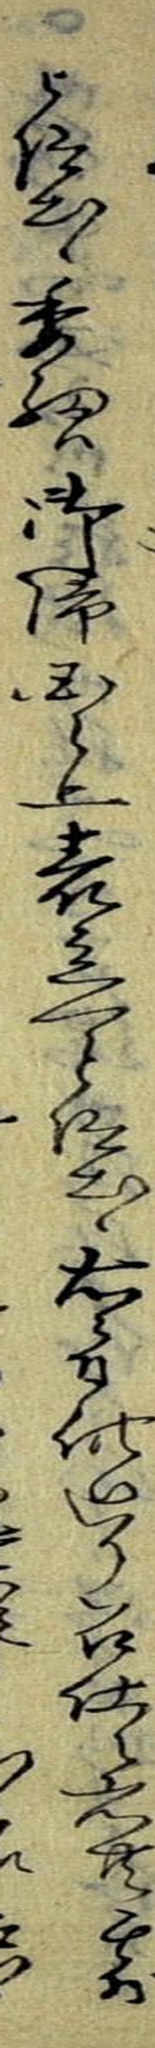被仰出候委細は御帰国之上表立可被仰出候右に付供廻り召仕候者共其外
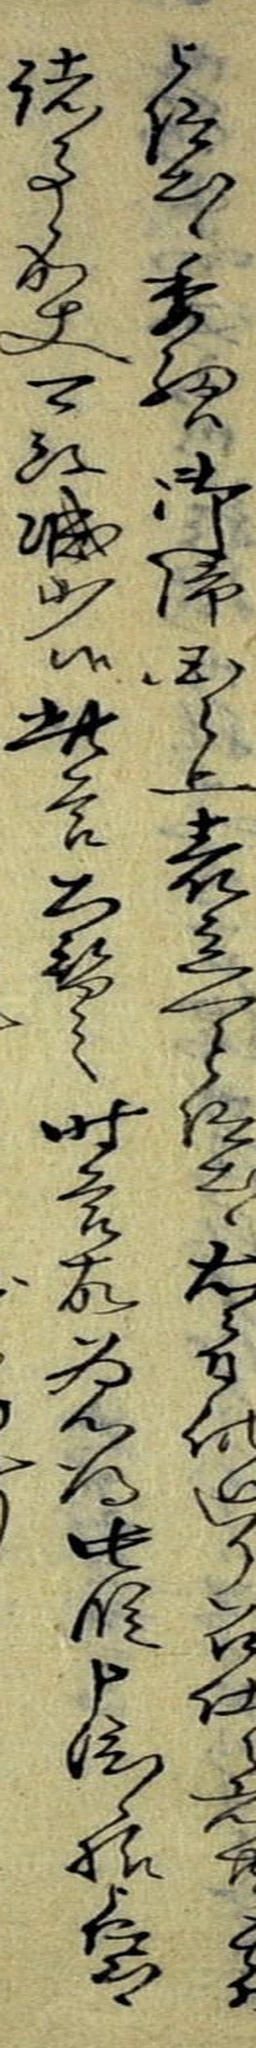諸事成丈可致減少候此節出替之時節故為心得此段申渡候様被仰出候
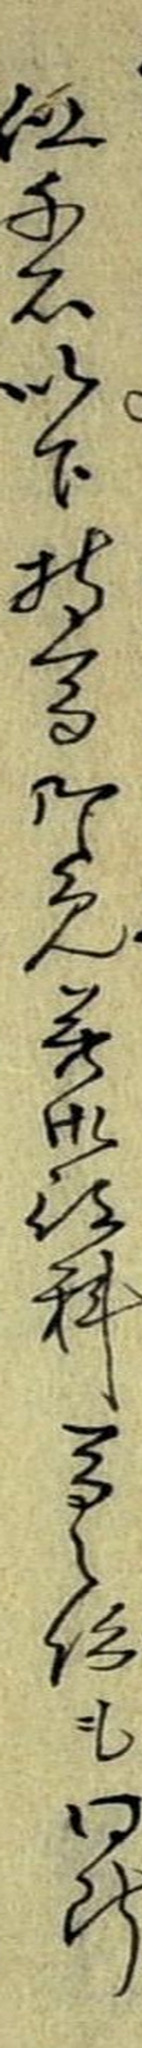但千石以下持馬御免井御役料馬之儀も同断
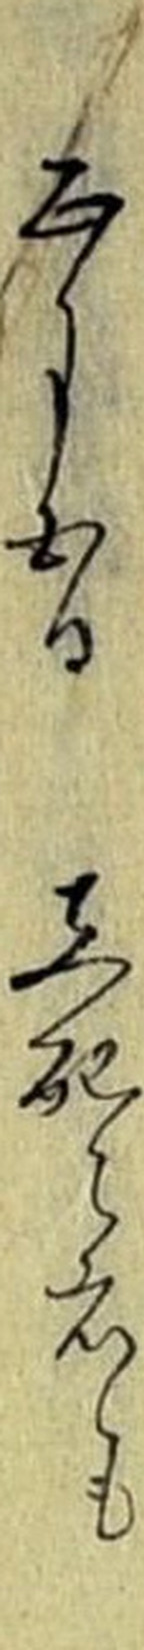正月五日支配之者へも
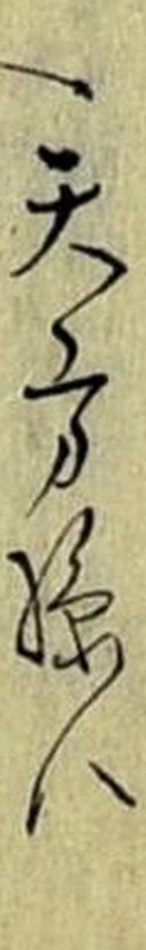天方孫八
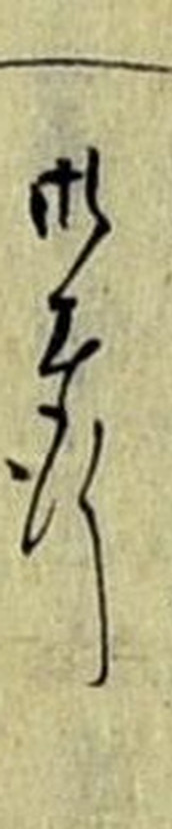御奉行
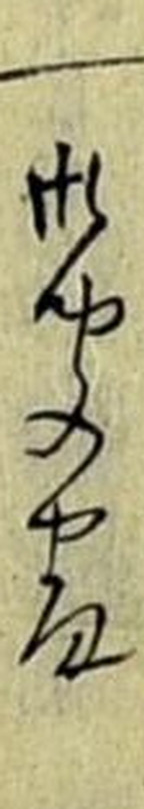御使番
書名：命令之部 四
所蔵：福井県文書館 Fukui Prefectural Archives
